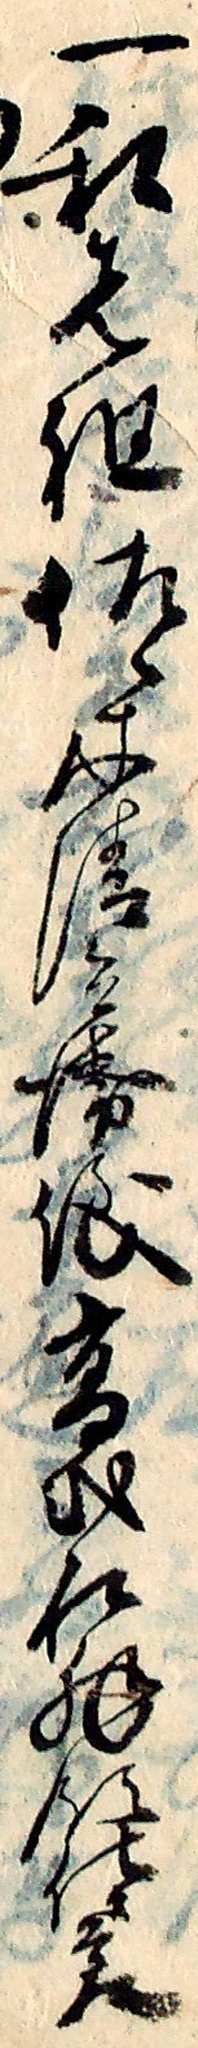一私先祖佐々木清兵衛儀高弐石拝領仕候節
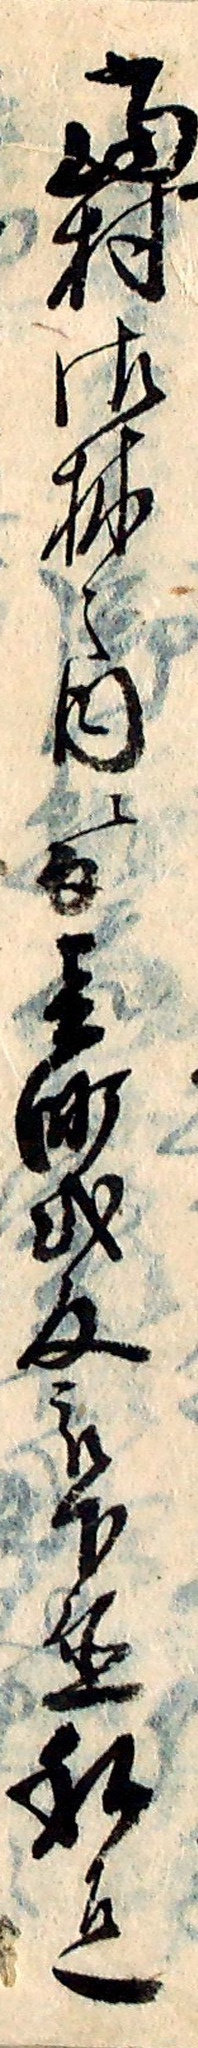当村御林之内にて壱町弐反被下置私迄
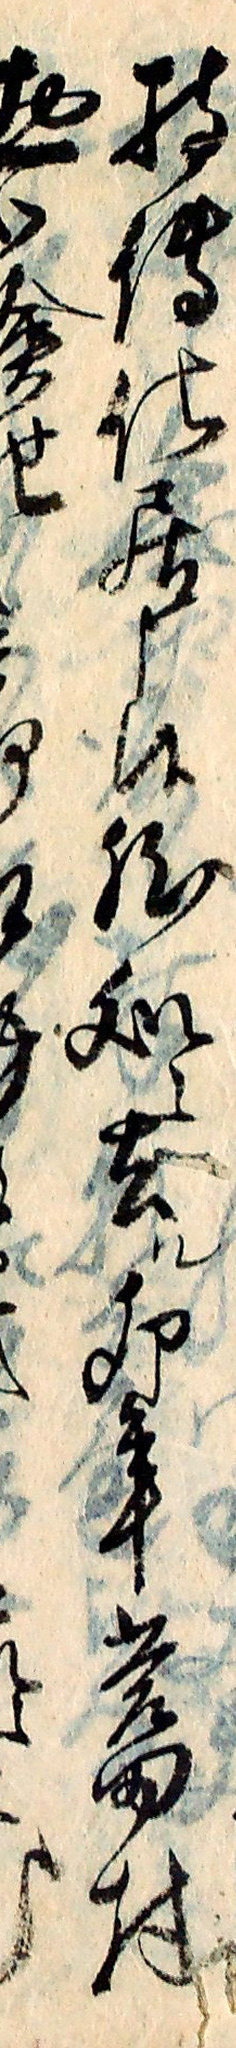持伝仕居申候然処に去る卯年当村
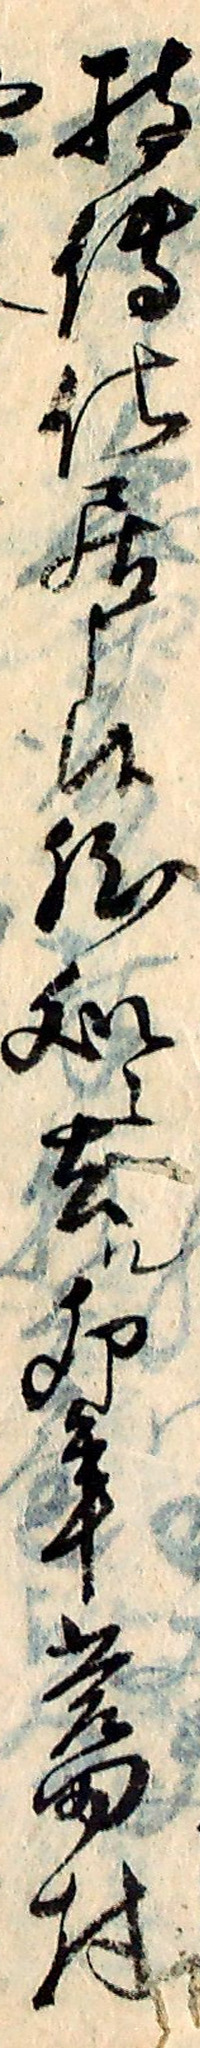持伝仕居申候然処に去る卯年当村
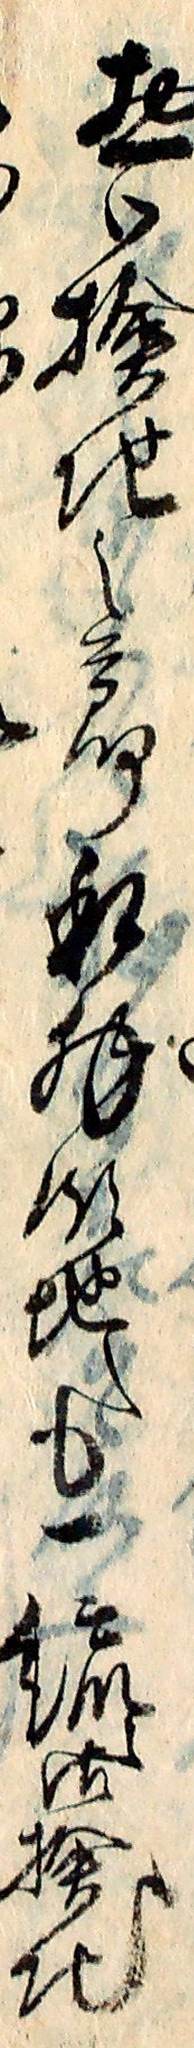惣御検地之節私拝領地へも一統に御検地
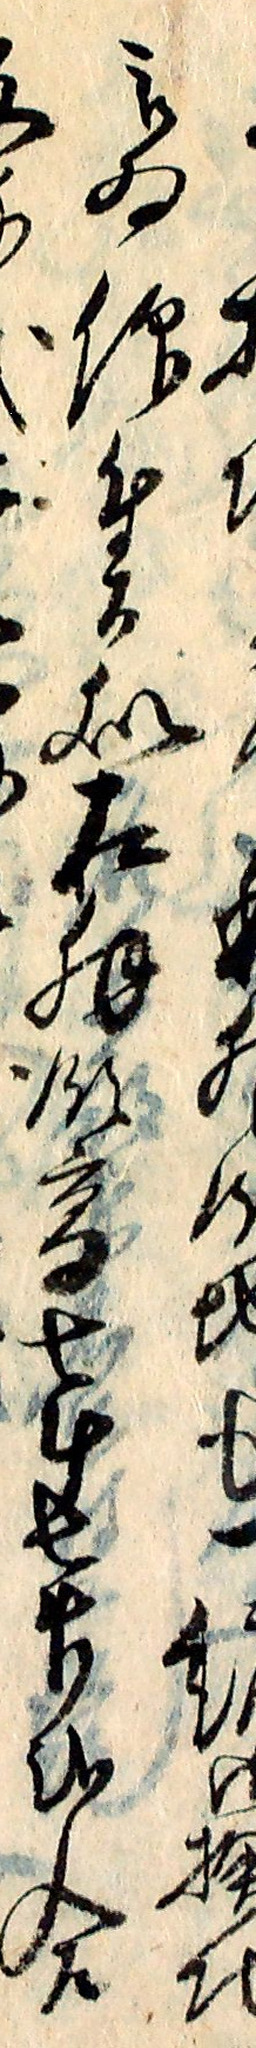被為仰付候処右拝領高七斗七升弐合
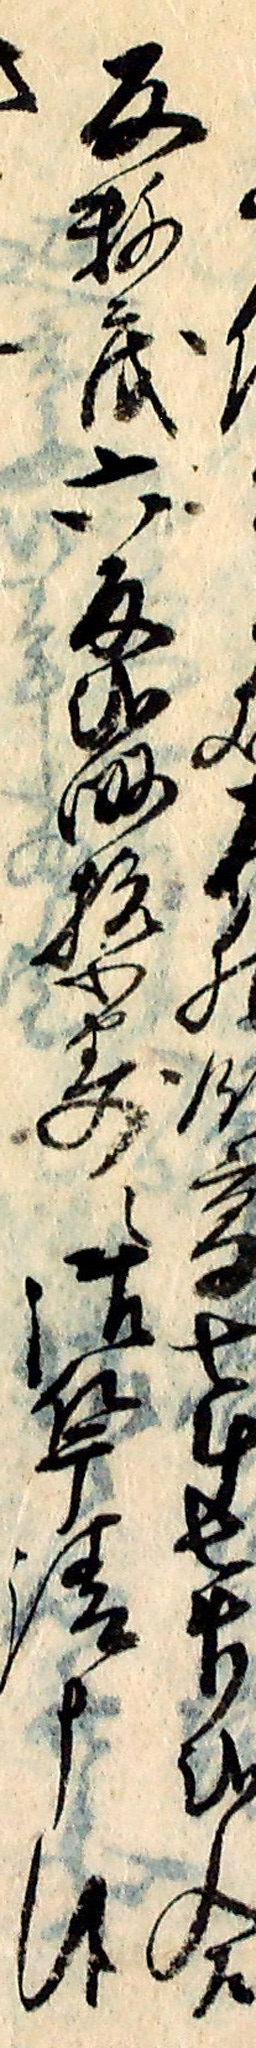反数も六反弐畝拾五歩之御竿請申候
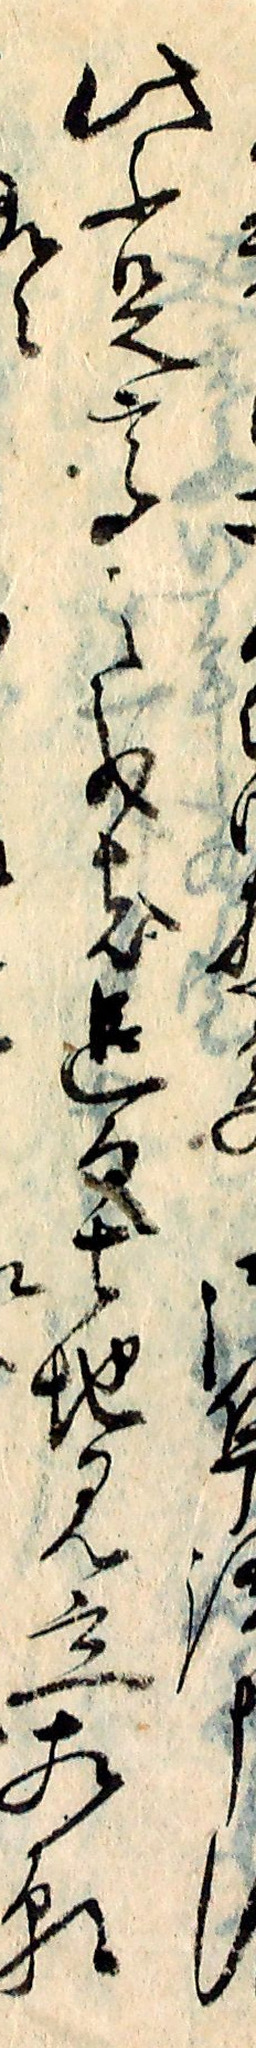此不足高之義は追て土地見立相願
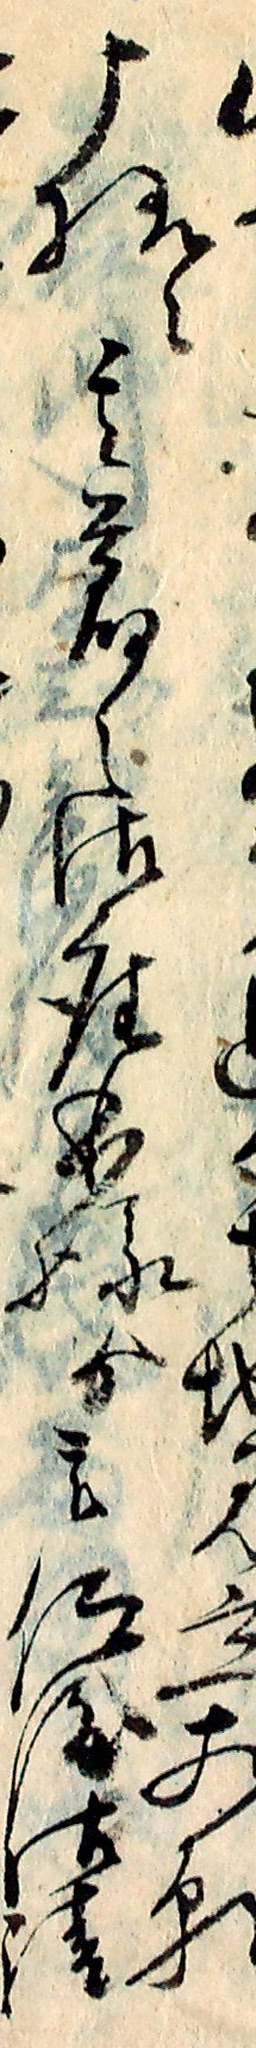申様に其節之御座本様ゟ被仰渡御請
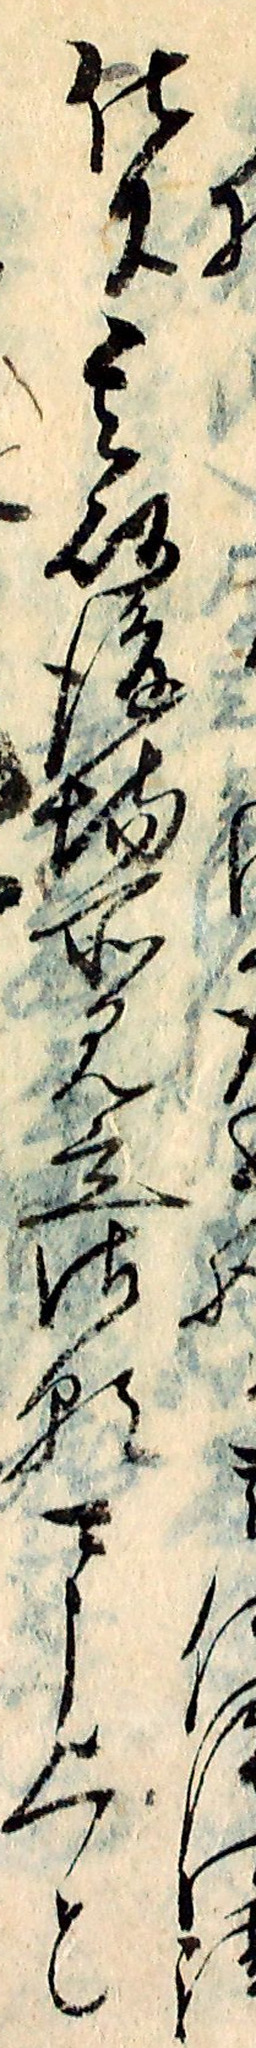仕候其以後場所見立御願可申上と
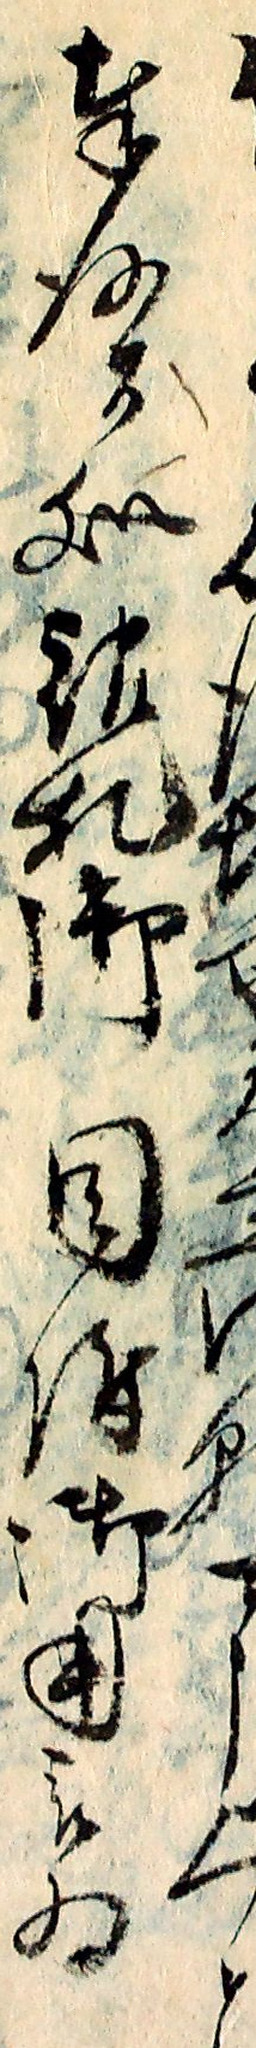奉存候処銀札御目附御用被為
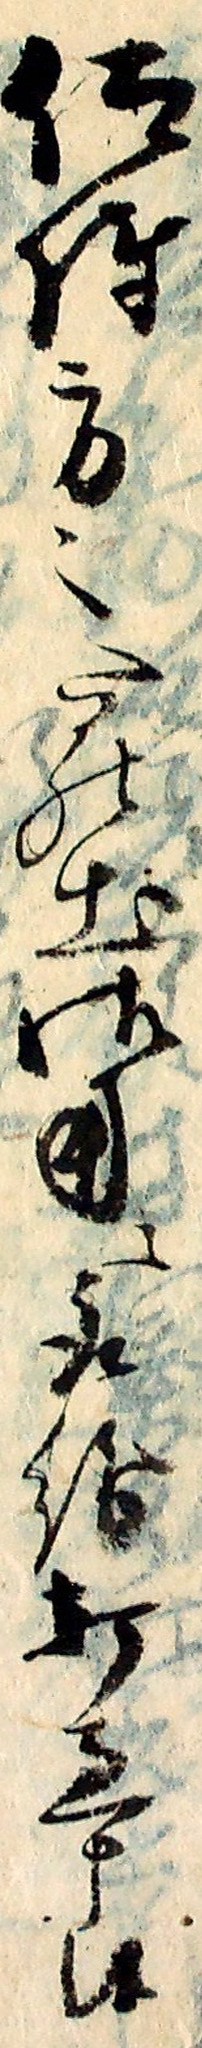仰付方々へ罷出御用に取紛打過申候
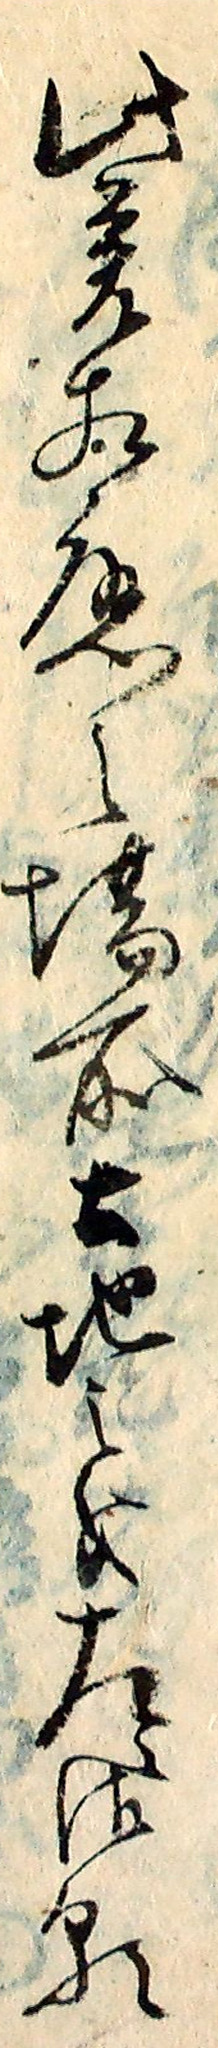此差相応之場所土地之義左に御願
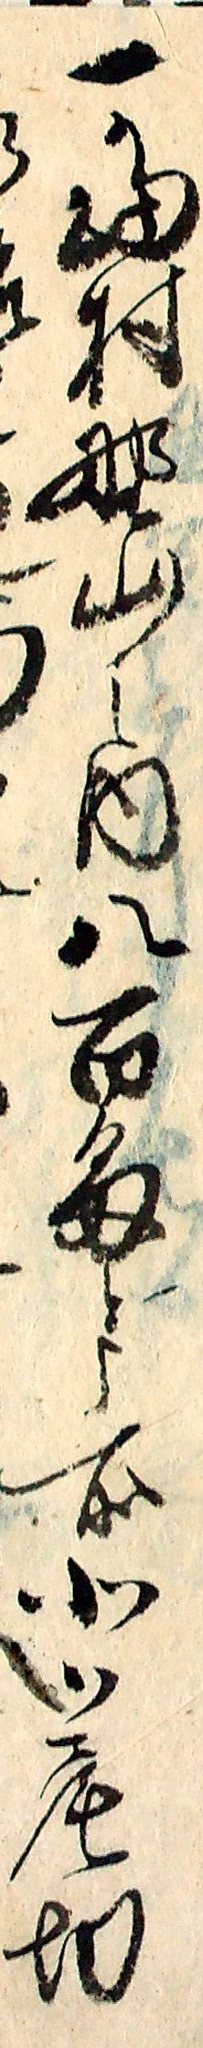一当村野山之内八百畠と申所北は尾切
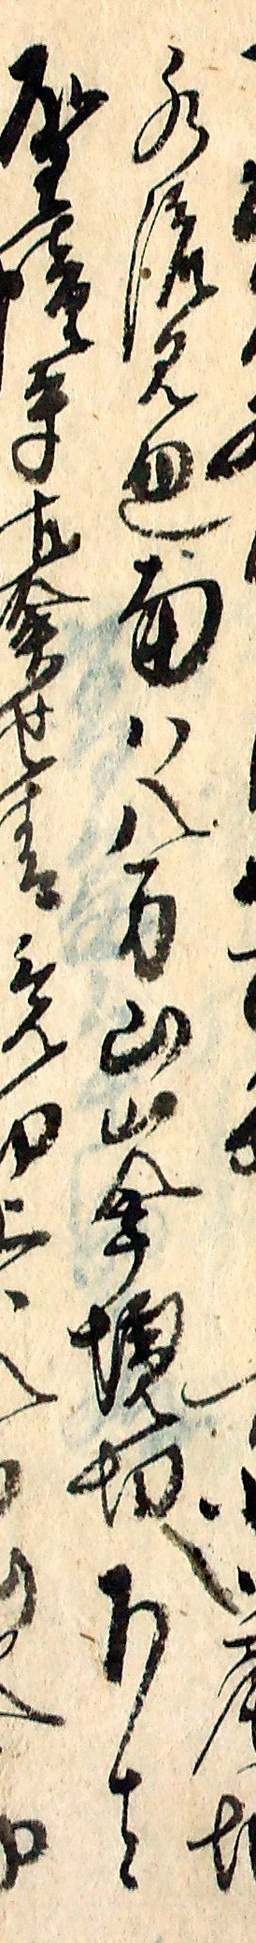水流見通南は八万山峯境切下は
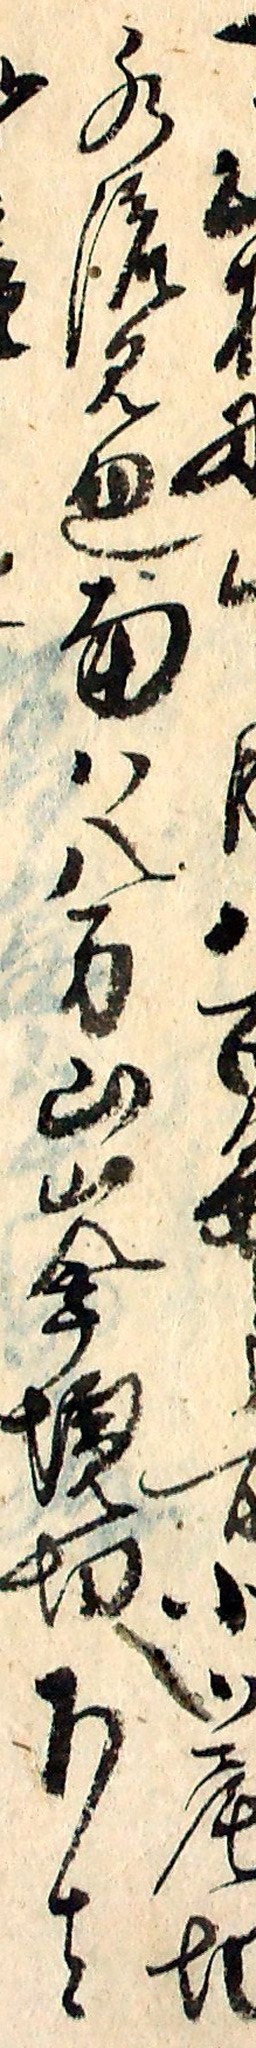水流見通南は八万山峯境切下は
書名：諸御願書控(後藤氏壱番）
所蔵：鳴門教育大学 Naruto University of Education
